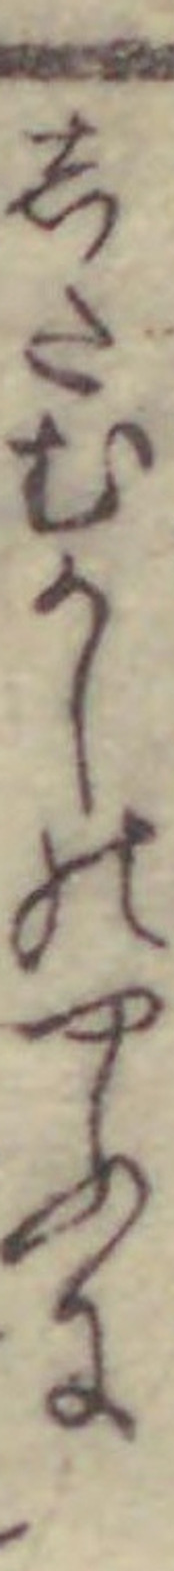したむかしのやふに
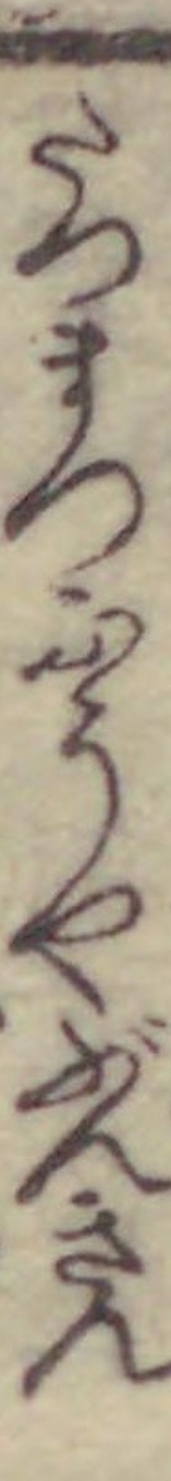たつまつふうやぶんきん
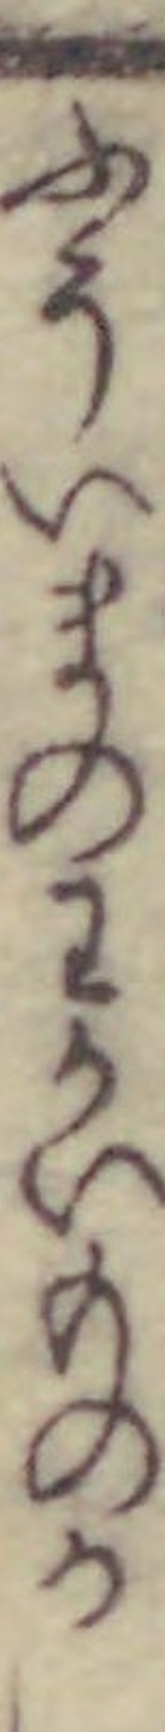ふういまのわかいものか
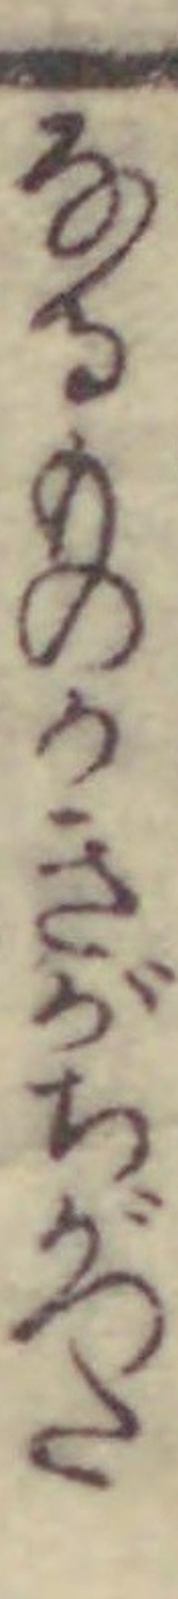なるものかきがちがつた
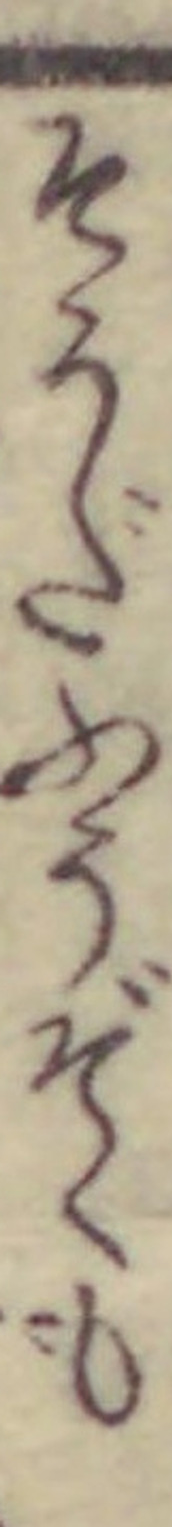そうだふうぞくも
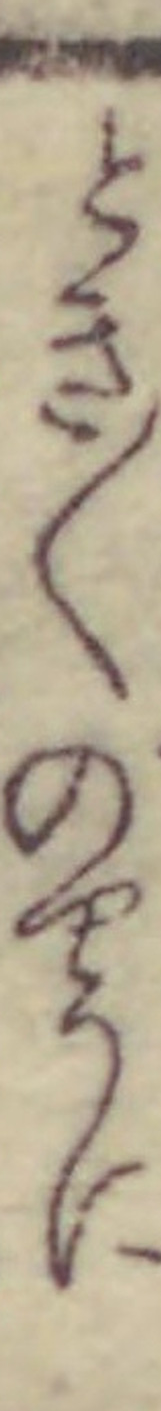とき〳〵のやうに
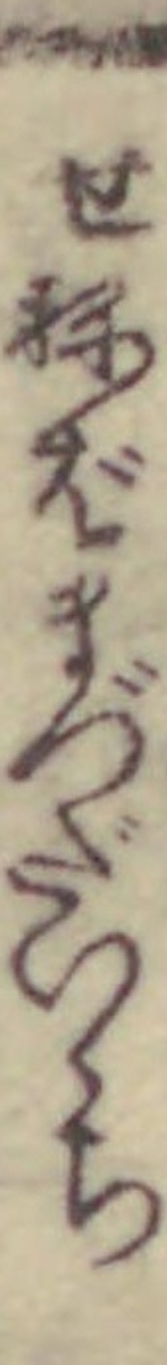せねばまづだいゝち
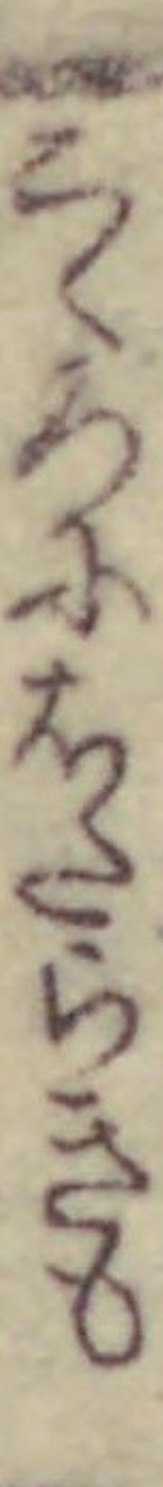こゝろにはたらきも
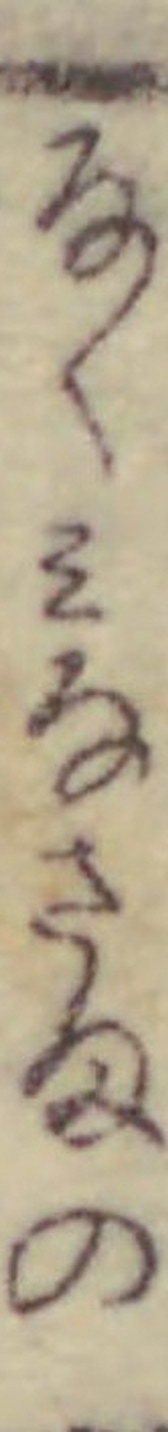なくみなさまの
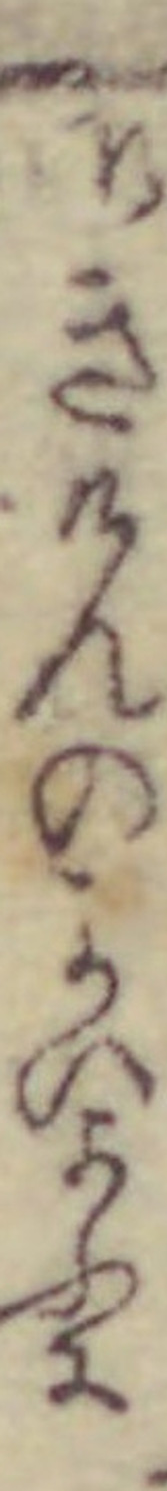御きけんのよいよふに
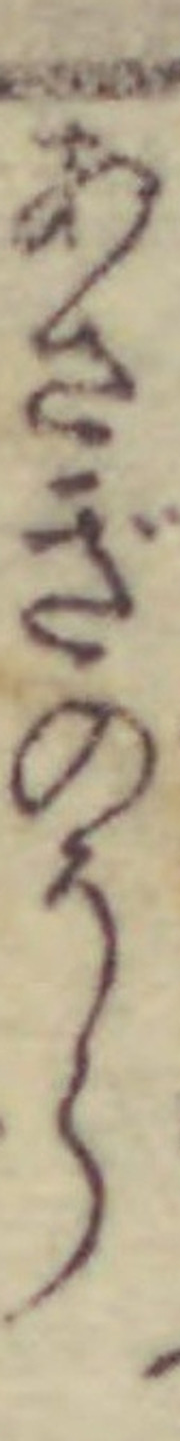あさぎのうら
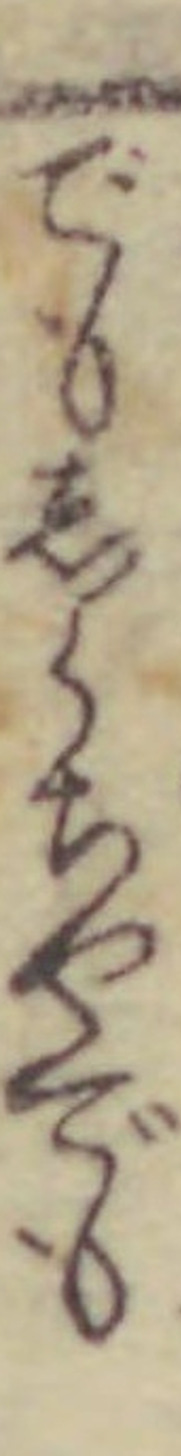でもしらちやでも
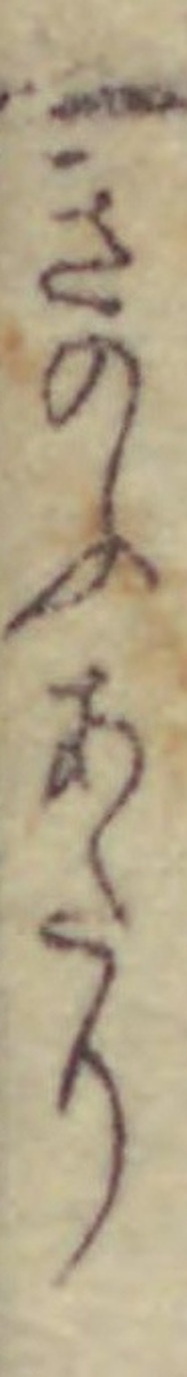きのふあたり
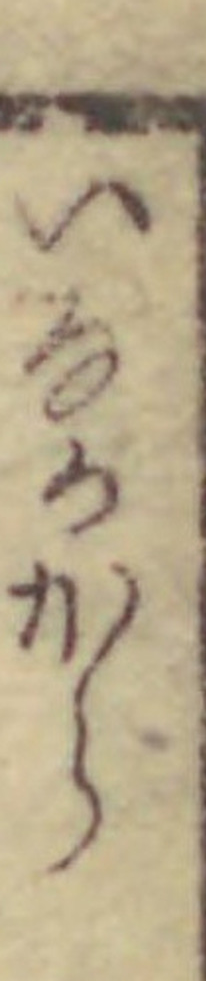いなかから
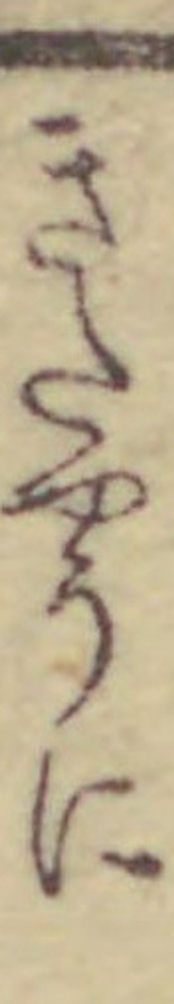きたやうに
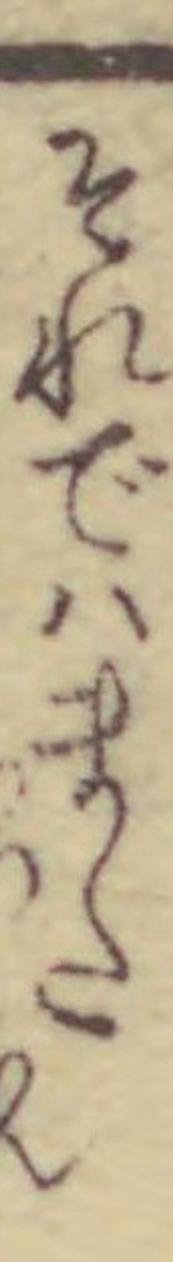それではまた
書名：大通人穴[サガシ] 3巻
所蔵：国立国会図書館 National Diet Library, JAPAN
